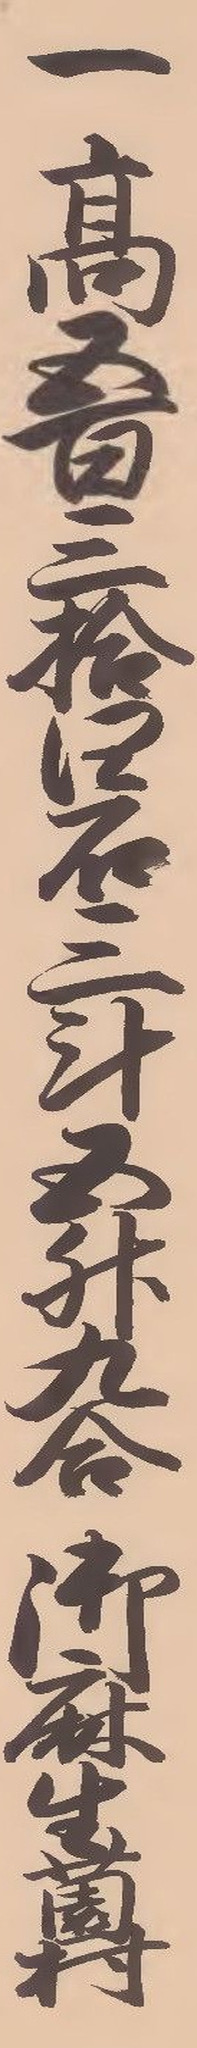一高五百三拾四石三斗五升九合御麻生薗村
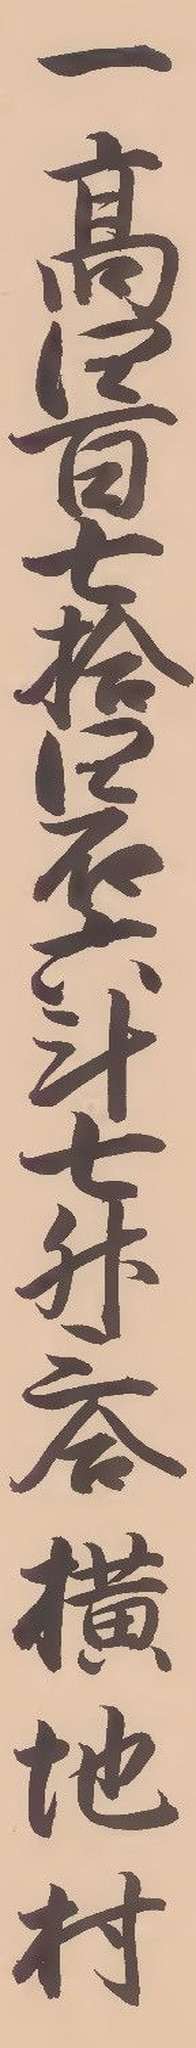一高四百七拾四石六斗七升三合横地村
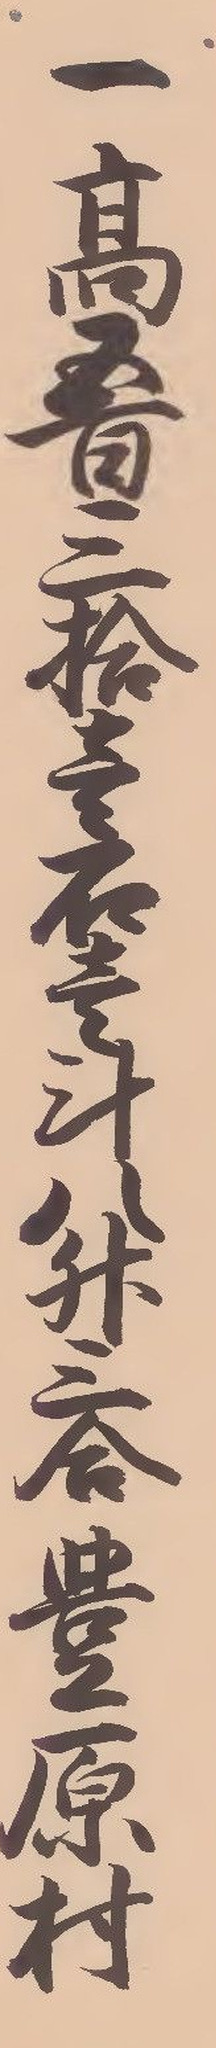一高五百三拾壱石壱斗八升三合豊原村

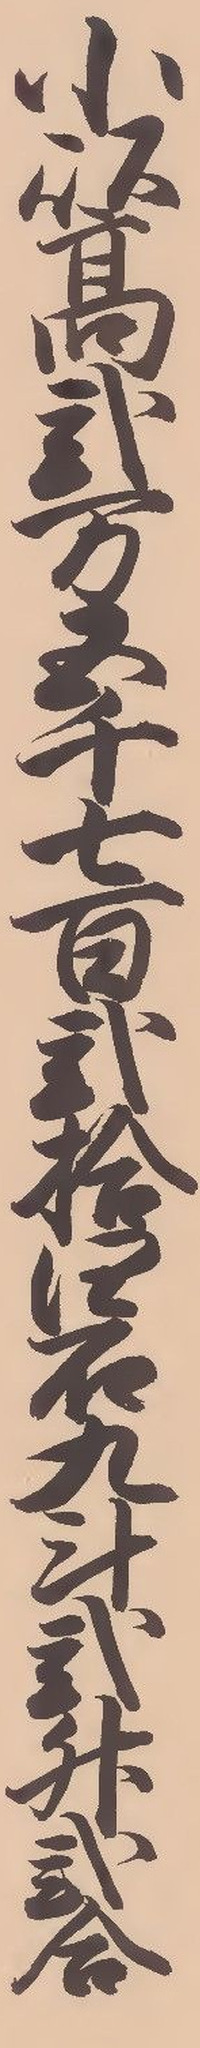小以高弐万五千七百弐拾四石九斗弐升弐合
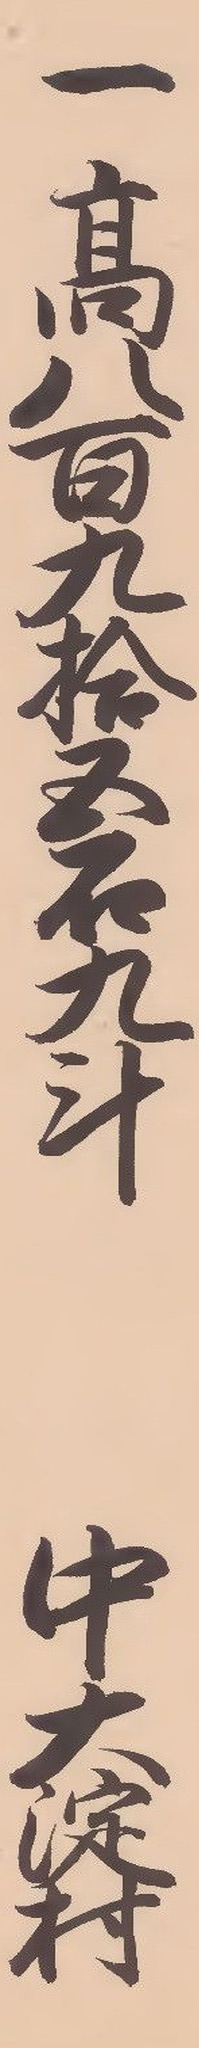一高八百九拾五石九斗中大淀村
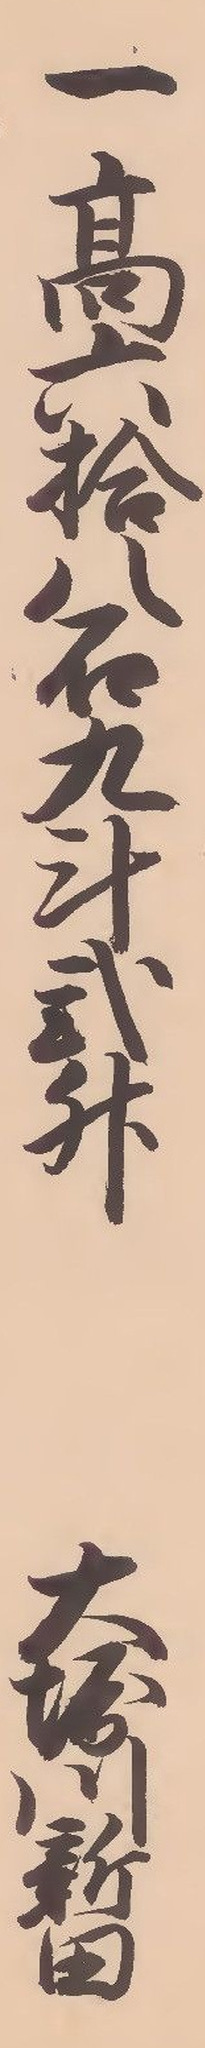一高六拾八石九斗弐升大堀川新田
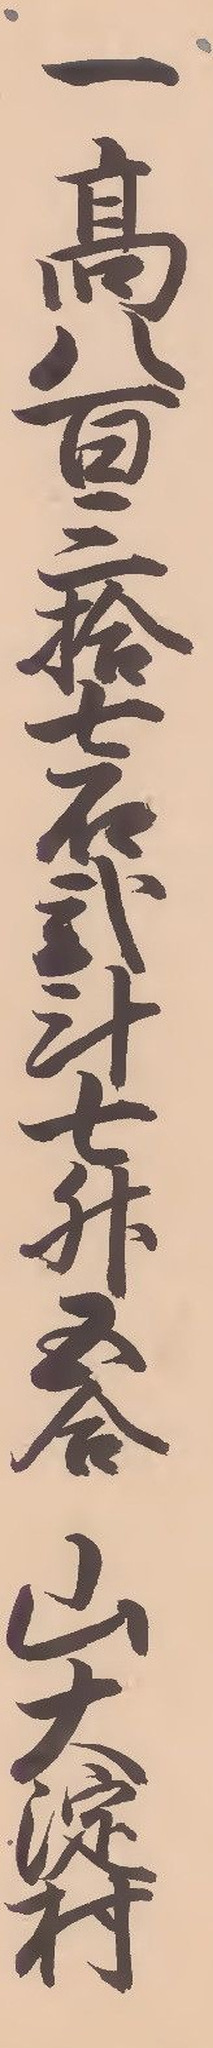一高八百三拾七石弐斗七升五合山大淀村

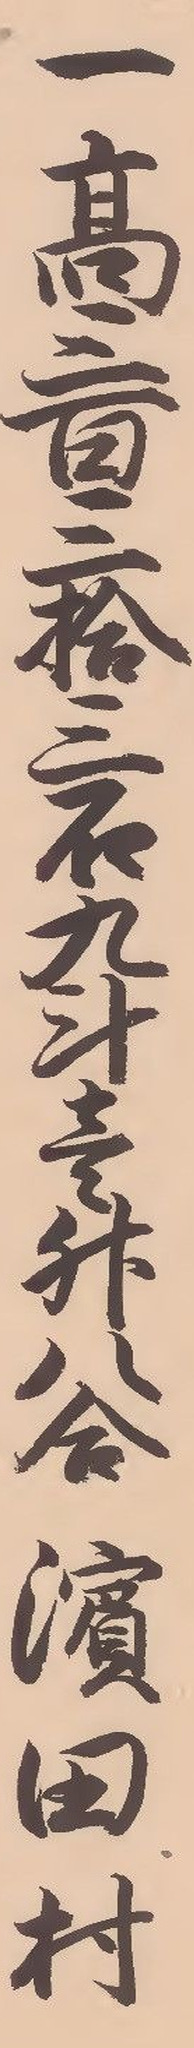一高三百三拾三石九斗壱升八合浜田村
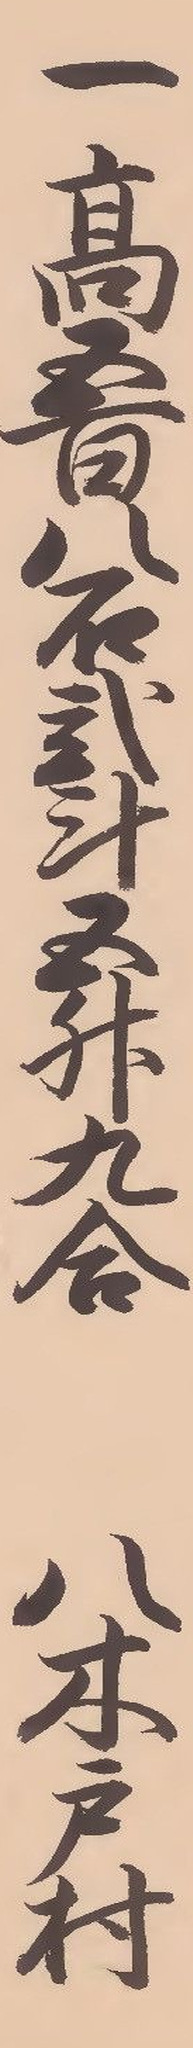一高五百八石弐斗五升九合八木戸村
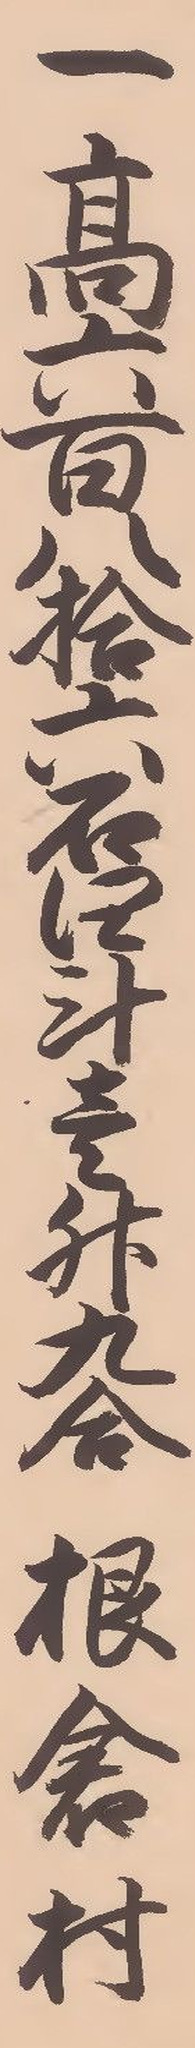一高六百八拾六石四斗壱升九合根倉村
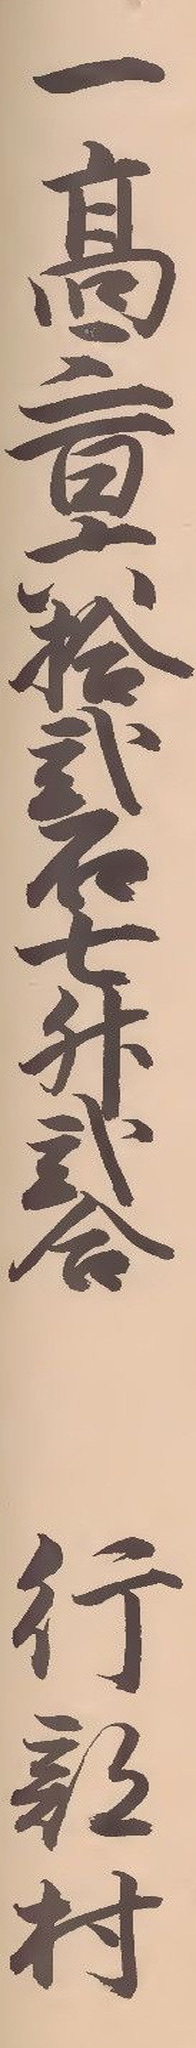一高三百六拾弐石七升弐合行部村
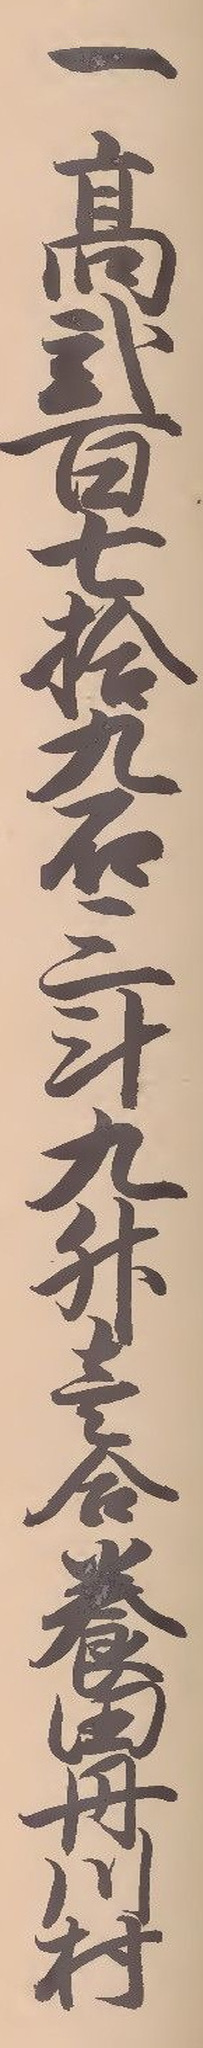一高弐百七拾九石三斗九升壱合養田丹川村
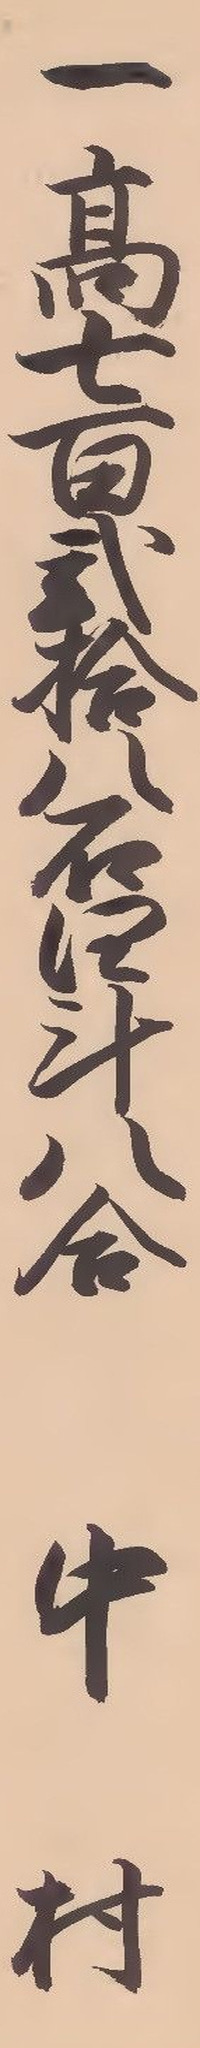一高七百弐拾八石四斗八合中村
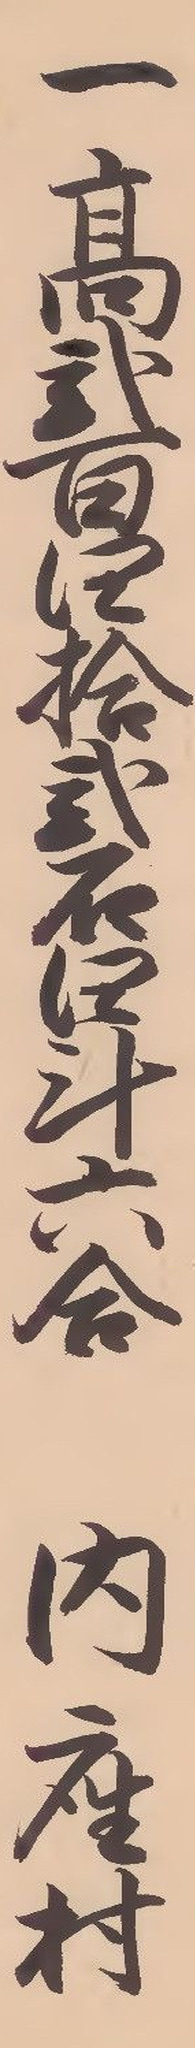一高弐百四拾弐石四斗六合内座村
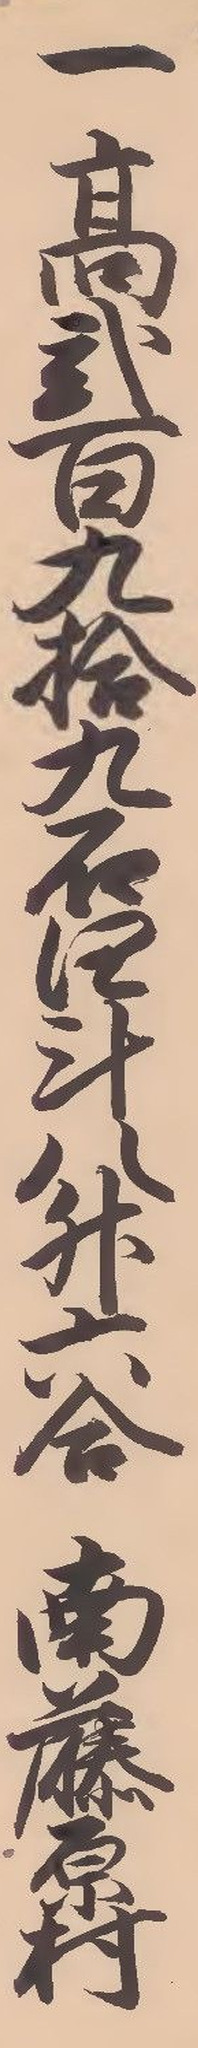一高弐百九拾九石四斗八升六合南藤原村

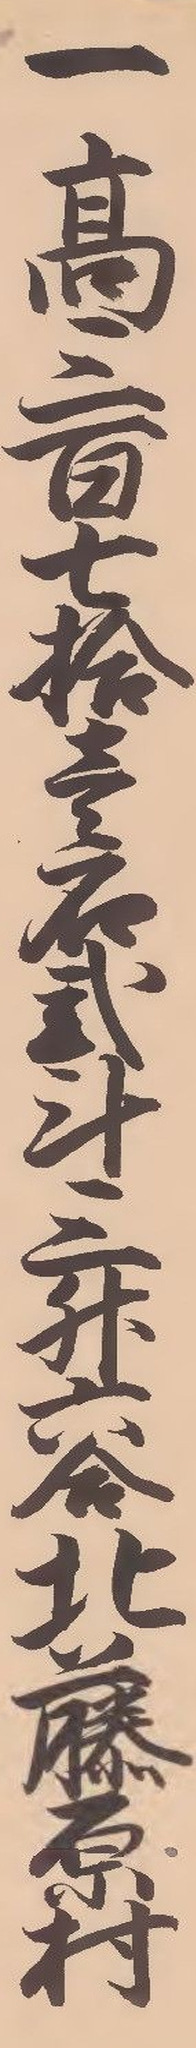一高三百七拾壱石弐斗三升六合北藤原村
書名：伊勢国郷帳
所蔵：国立公文書館 National Archives of Japan
